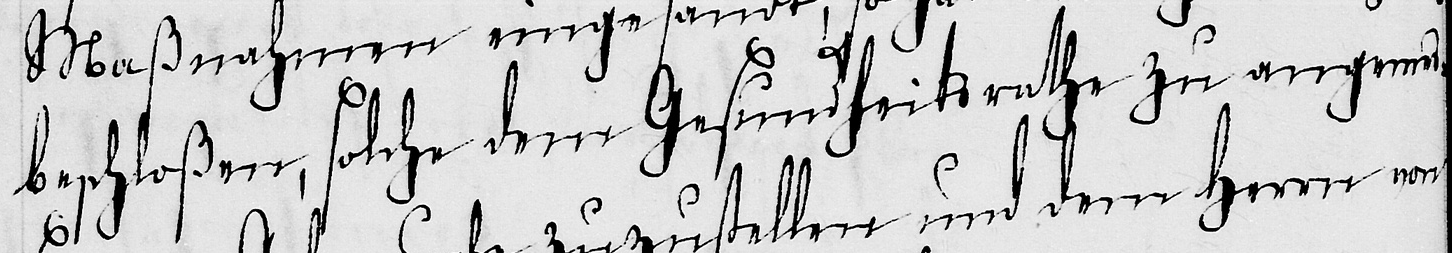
beschloßen, solche dem Gesundheitsrathe zu angeme¬
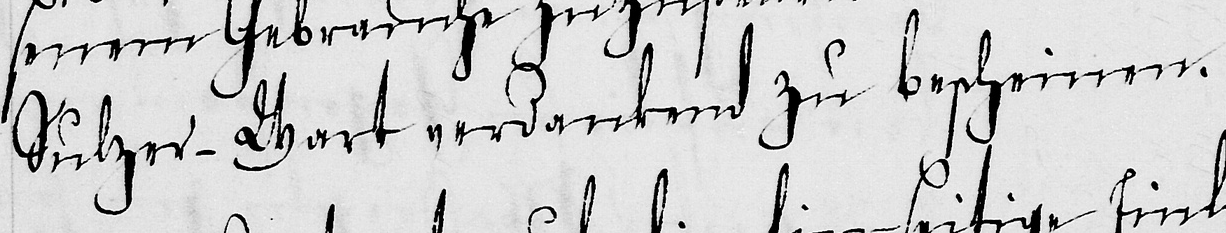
Sulzer-Wart verdankend zu bescheinen.
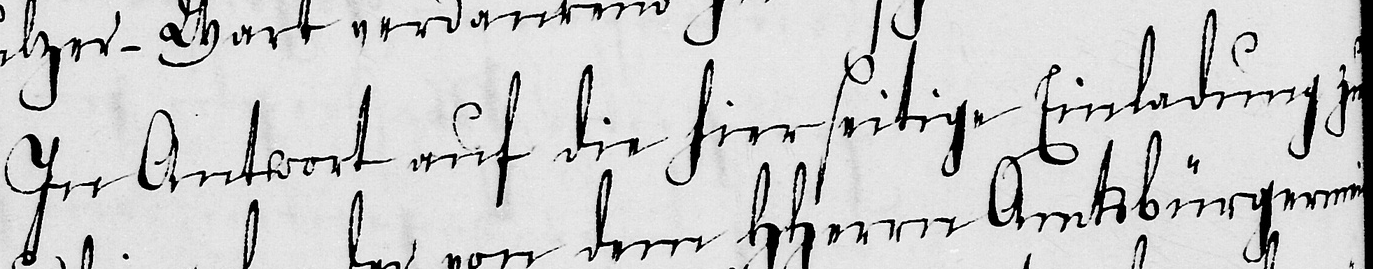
In Antwort auf die hierseitige Einladung zu
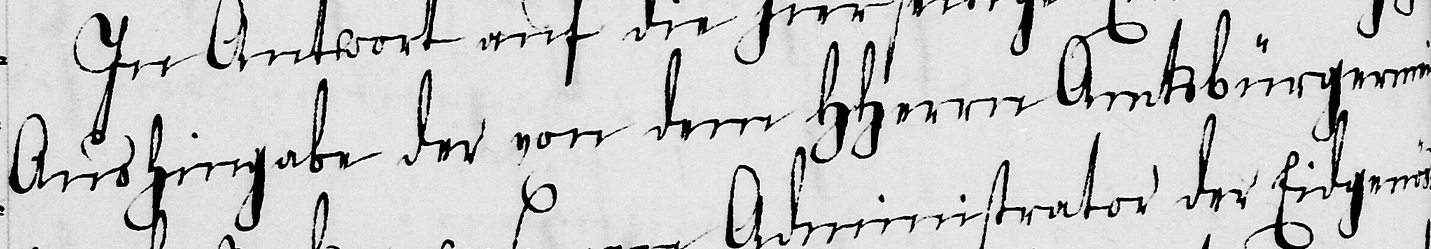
Aushingabe der von dem HHerrn Amtsbürgerm¬
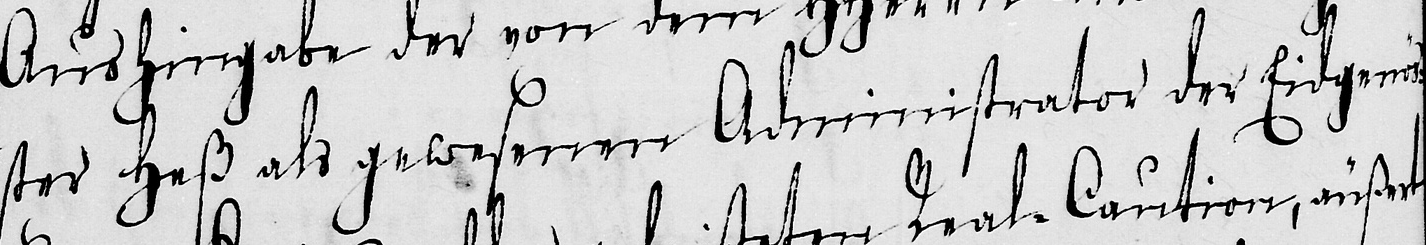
ster Heß als gewesenen Administrator der Eidgenö¬
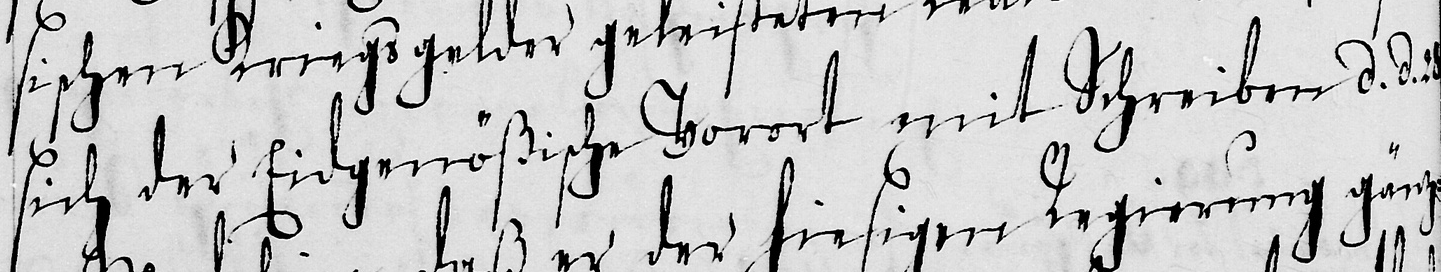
sich der Eidgenößische Vorort mit Schreiben d. d.
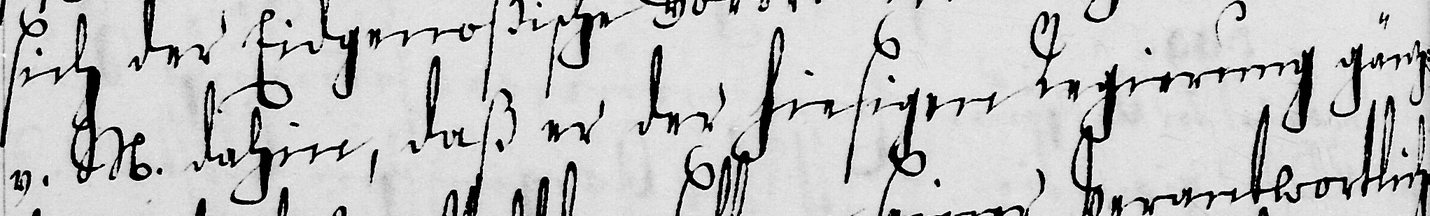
v. M. dahin, daß er der hiesigen Regierung gänz¬
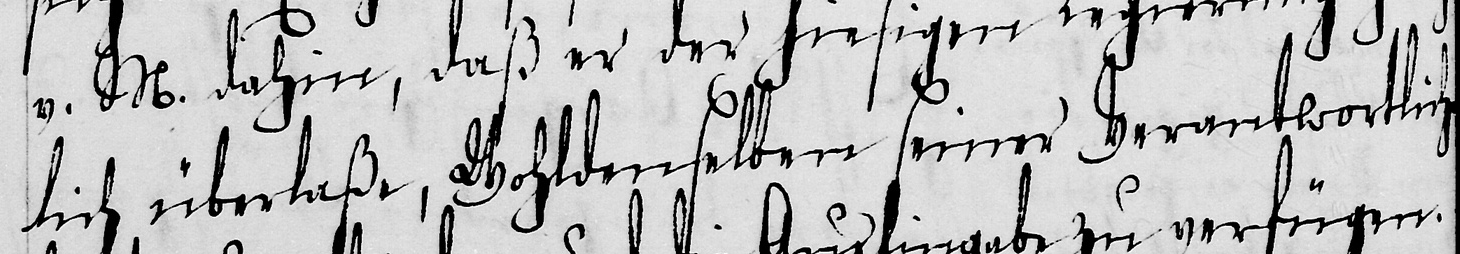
lich überlaße, Wohldenselben seiner Verantwortlic¬
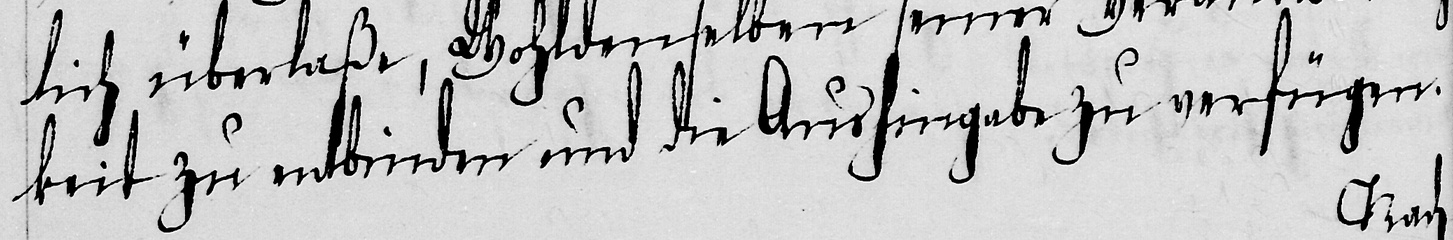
hkeit zu entbinden und die Aushingabe zu verfügen.
